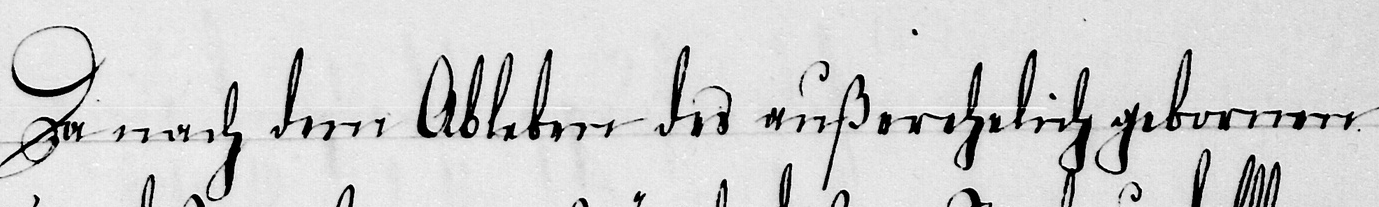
Da nach dem Ableben des außerehelich gebornen
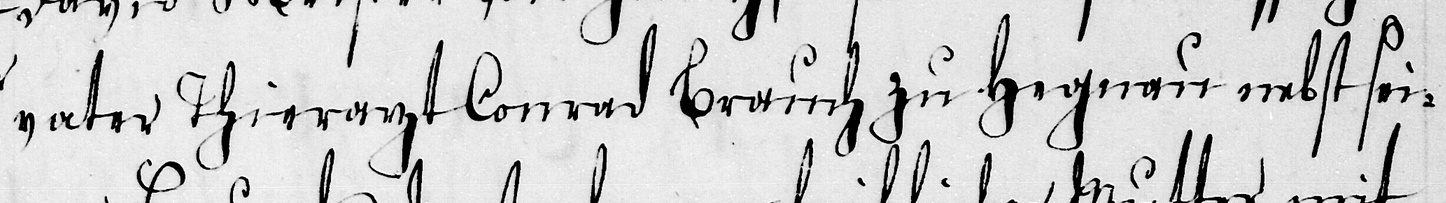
vater Thierarzt Conrad Brauch zu Hegnau nebst sei¬
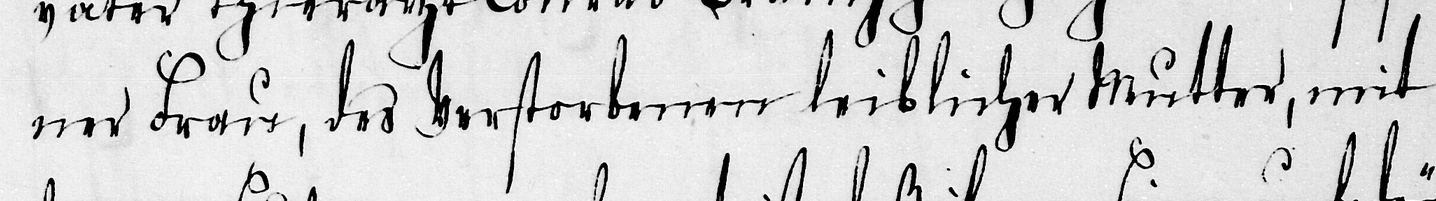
ner Frau, des Verstorbenen leiblicher Mutter, mit
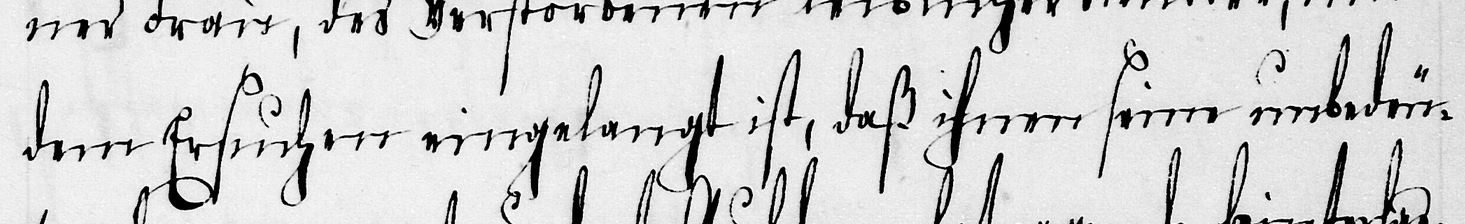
dem Ersuchen eingelangt ist, daß ihnen seine unbedeu¬
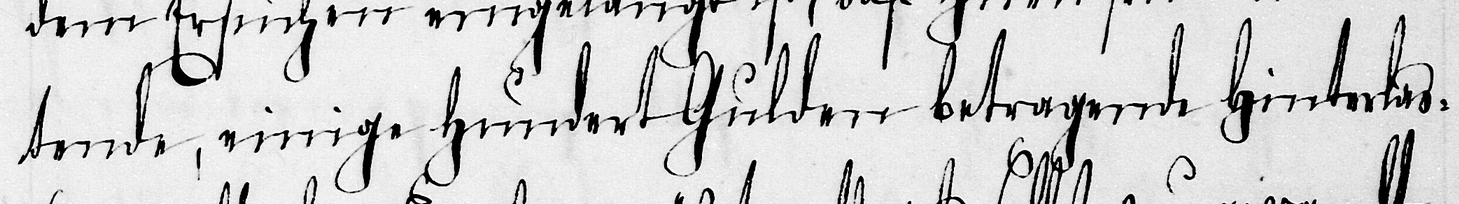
tende, einige hundert Gulden betragende Hinterlas¬
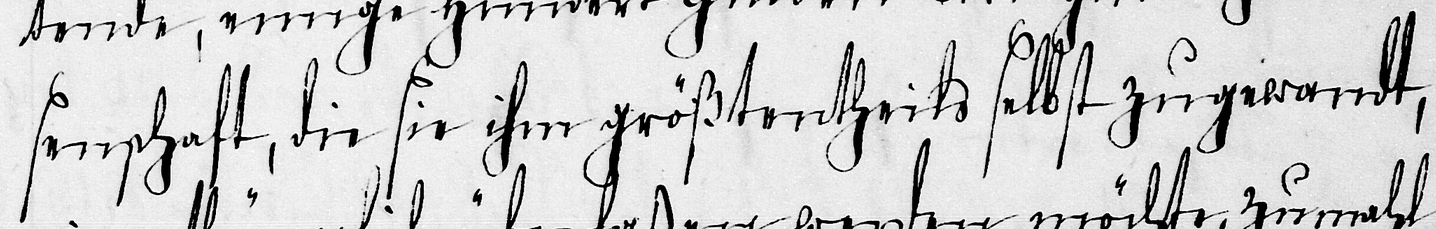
senschaft, die sie ihm größtentheils selbst zugewandt,
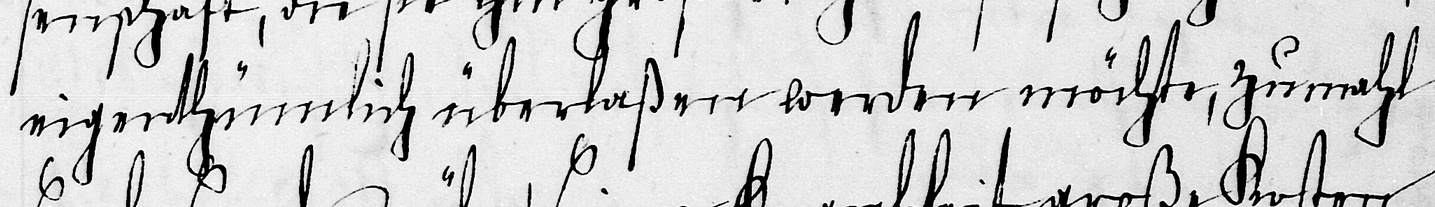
eigenthümlich überlaßen werden möchte, zumahl
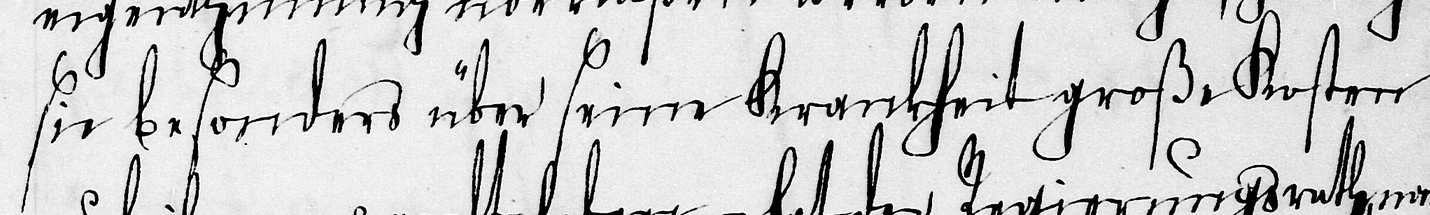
sie besonders über seine Krankheit große Kosten
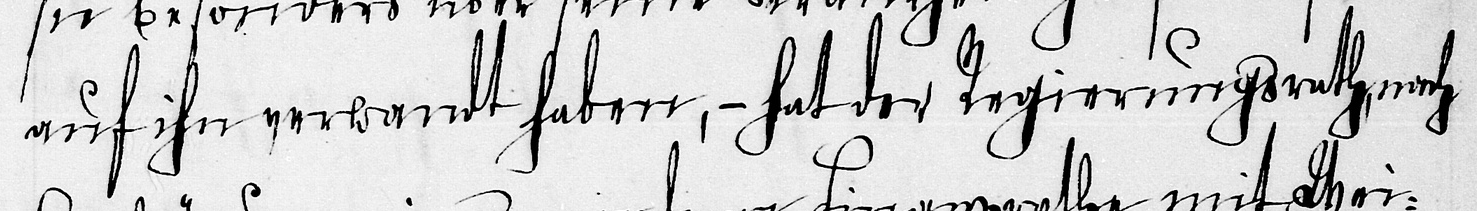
auf ihn verwandt haben, – hat der Regierungsrath, nach
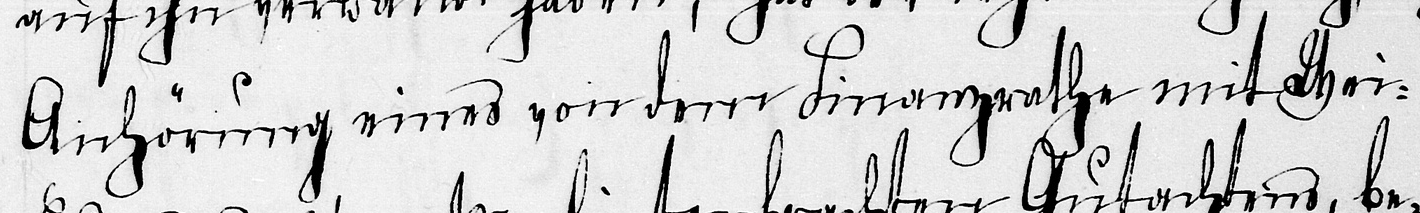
Anhörung eines von dem Finanzrathe mit Wei¬
